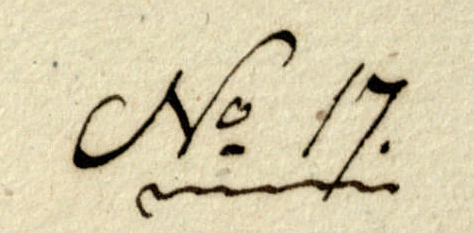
No 17.
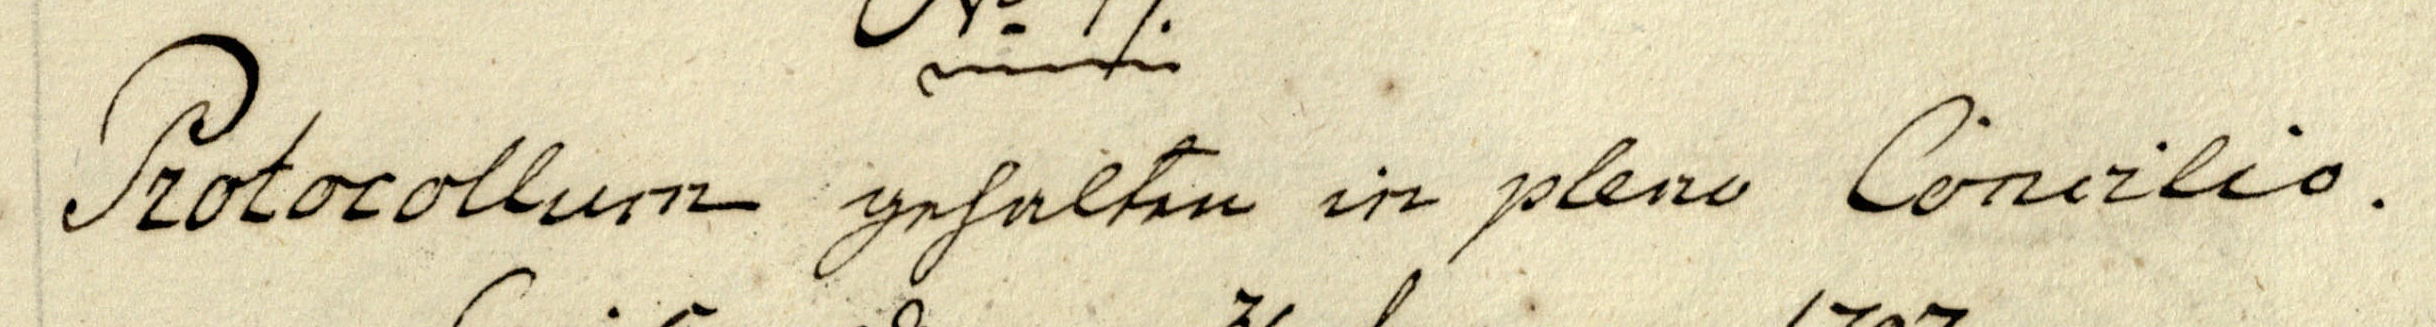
Protocollum gehalten in pleno Concilio.
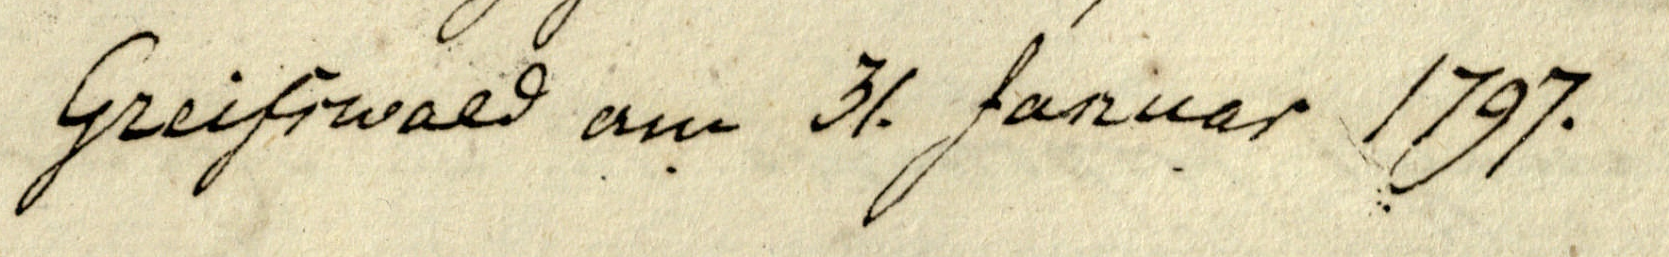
Greifswald am 31. Januar 1797.
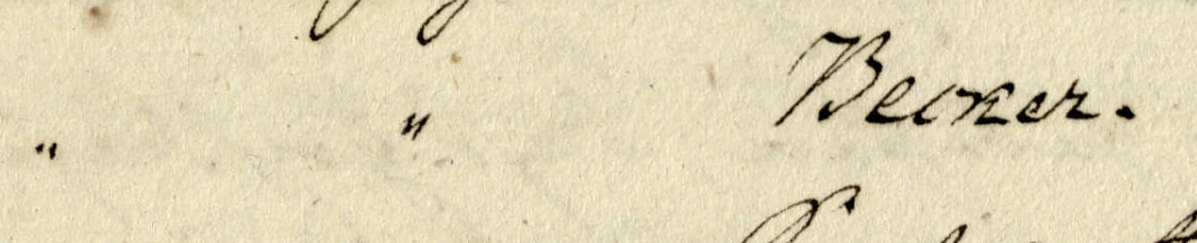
Becker.
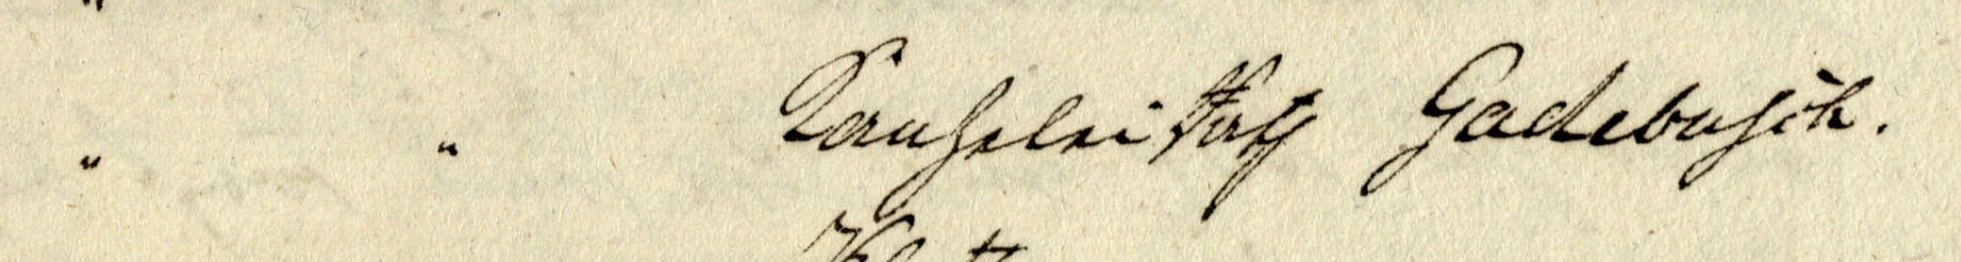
Kanzelei Rath Gadebusch.
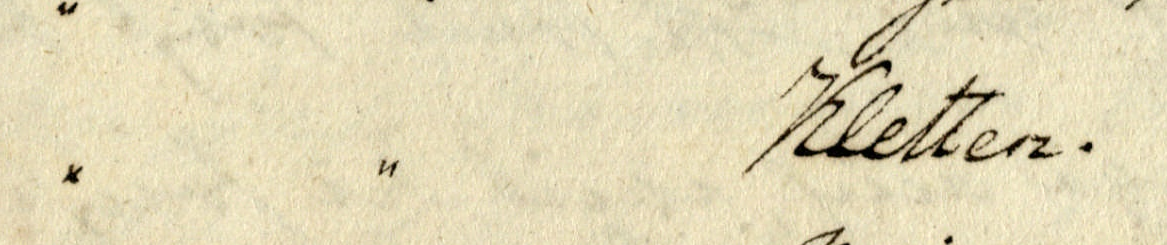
Kletten.
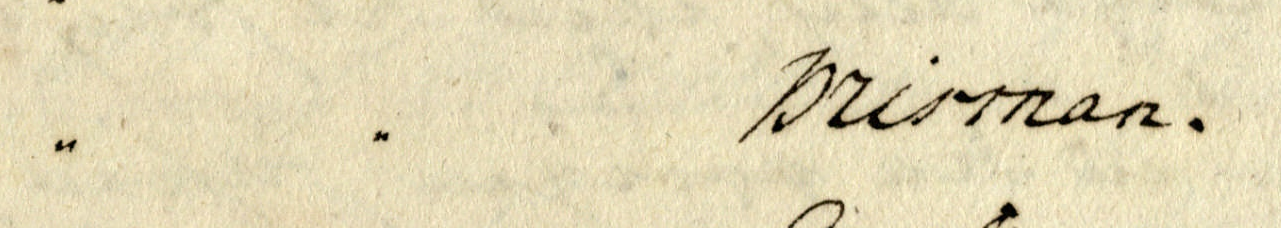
Brisman.
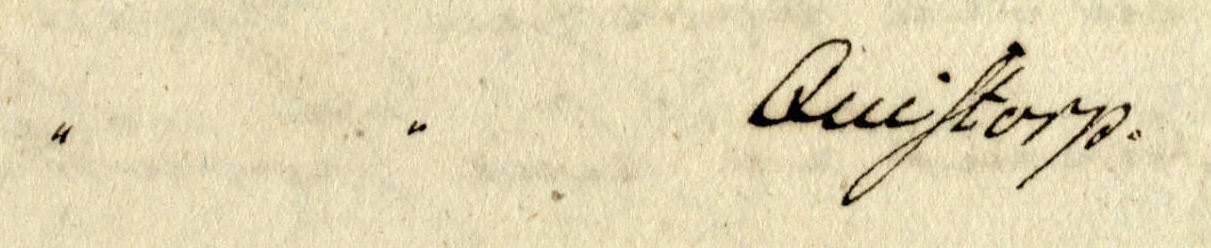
Quistorp.
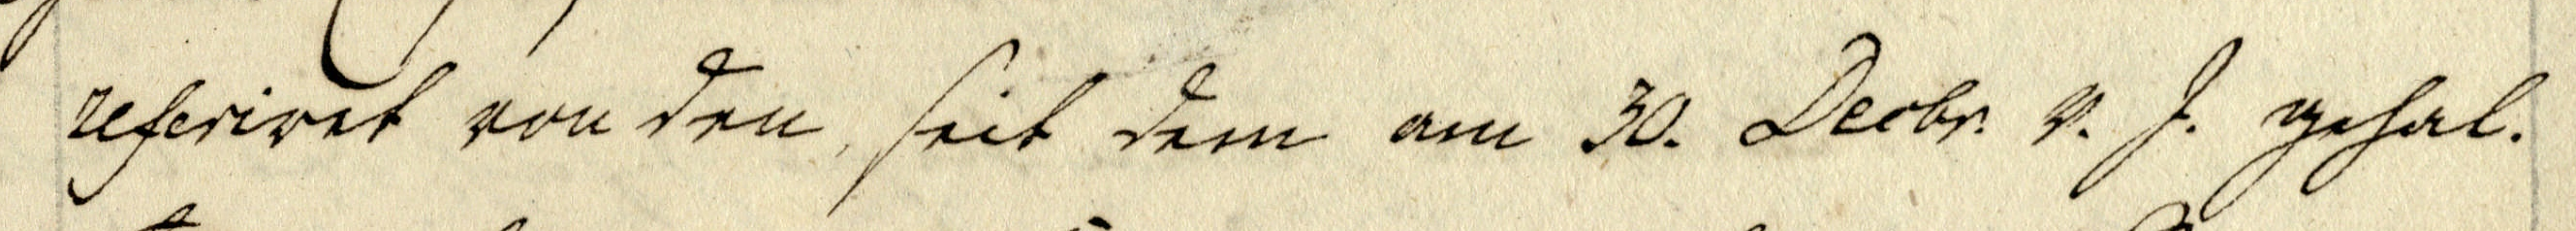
referiret von den, seit dem am 30. Decbr. v. J. gehal¬
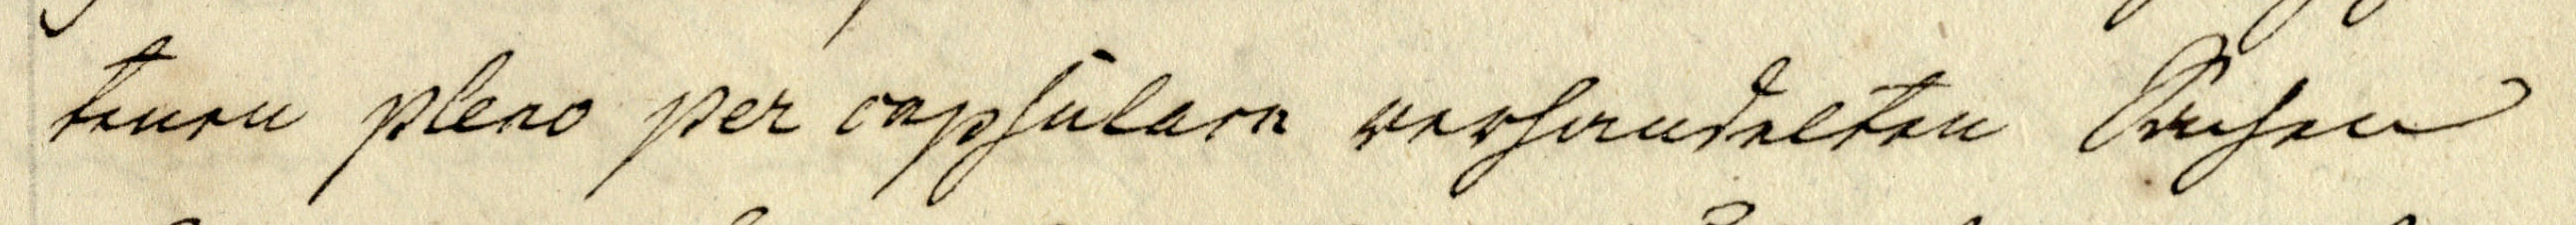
tenen pleno per capsulam verhandelten Sachen
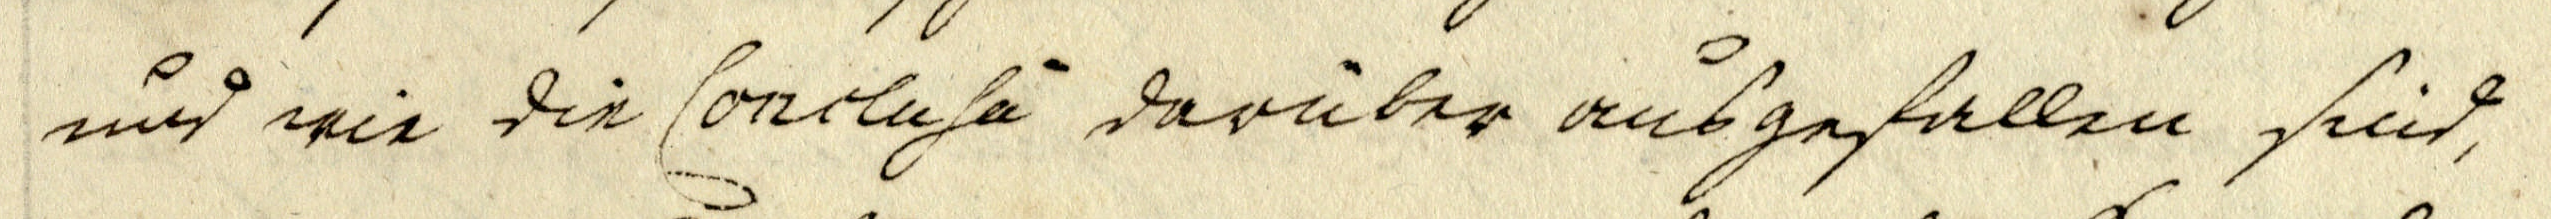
und wie die Conclusa darüber ausgefallen sind,
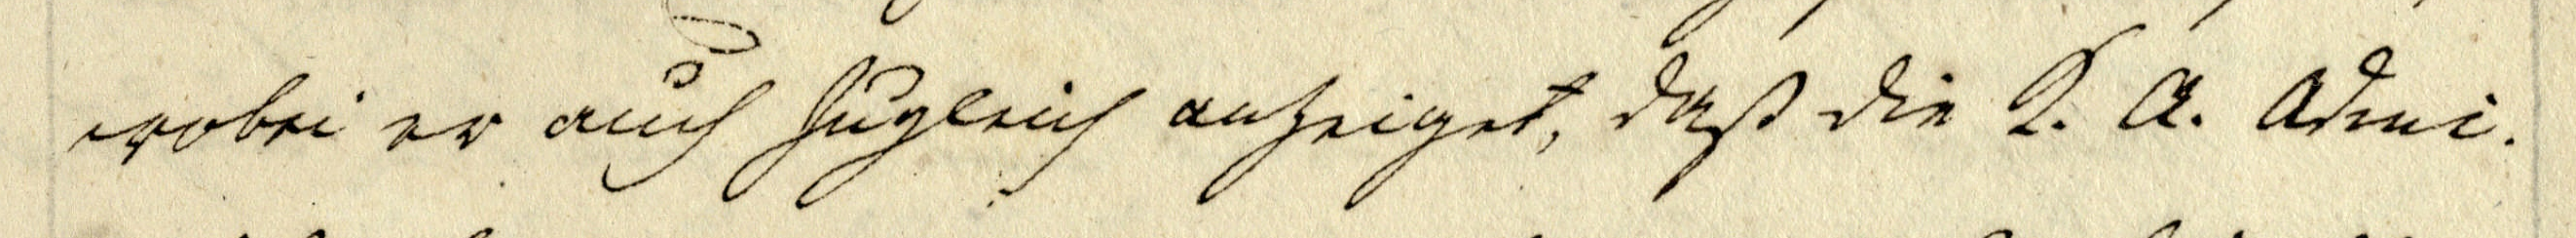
wobei er auch zugleich anzeiget, daß die K. A. Admi¬
